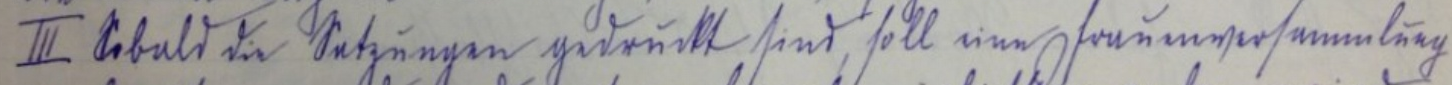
III. Sobald die Satzungen gedruckt sind, soll eine Frauenversammlung
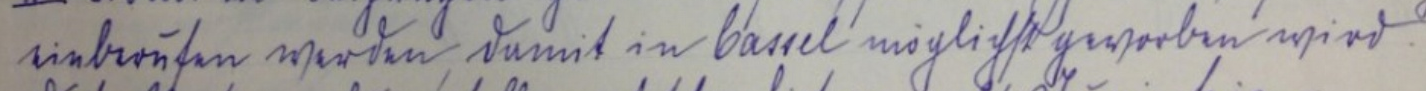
einberufen werden, damit in Cassel möglichst geworben wird.
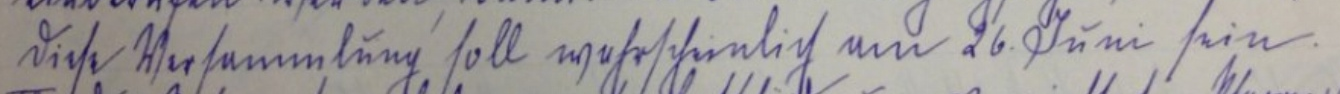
Diese Versammlung soll wahrscheinlich am 26. Juni sein.
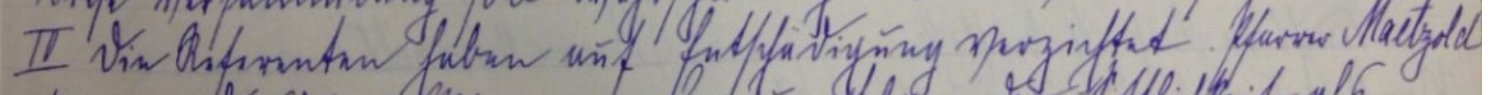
IV. Die Referenten haben auf Entschädigung verzichtet. Pfarrer Mätzold
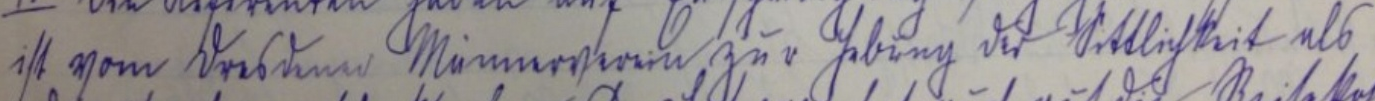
ist vom dresdener Männerverein zur Hebung der Sittlichkeit als
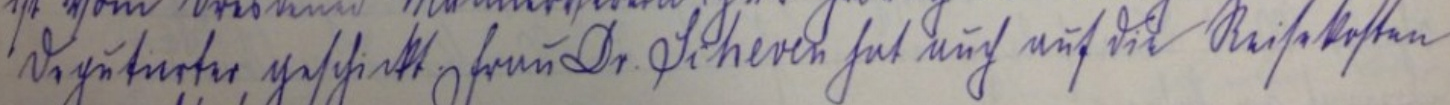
Deputierter geschickt. Frau Dr. Siheven hat auch auf die Reisekosten
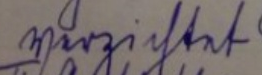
verzichtet.
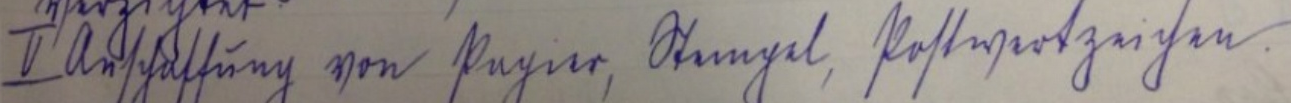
V. Anschaffung von Papier, Stempel, Postwertzeichen
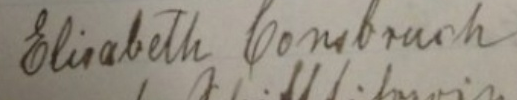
Elisabeth Consbruck
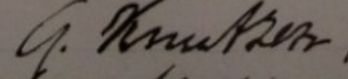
G. Knutzen
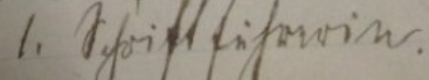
I. Schriftführerin
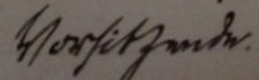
Vorsitzende
